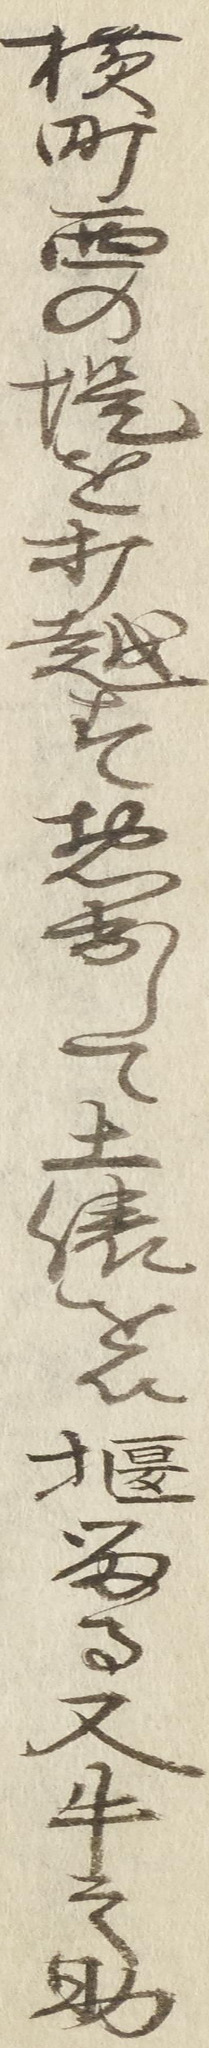横町西の提を打越す惣出して土俵を以堰留る又牛之助
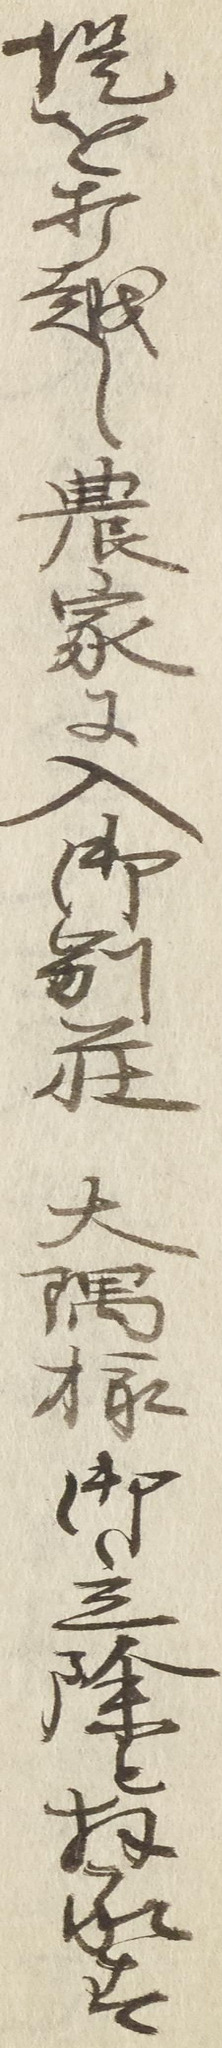提を打越し農家に入御別荘大隅様御立除と拝承す
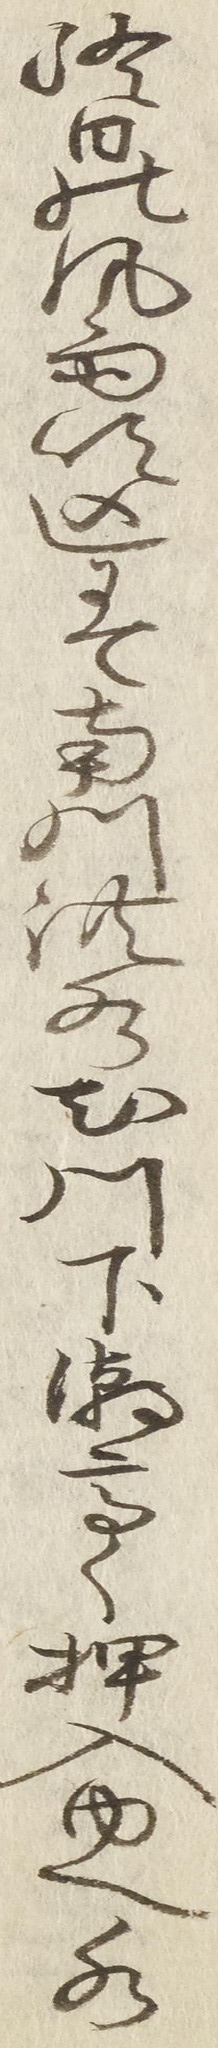終日の風雨吹込にて南川洪水尤川下潮高く押入ゆへ水
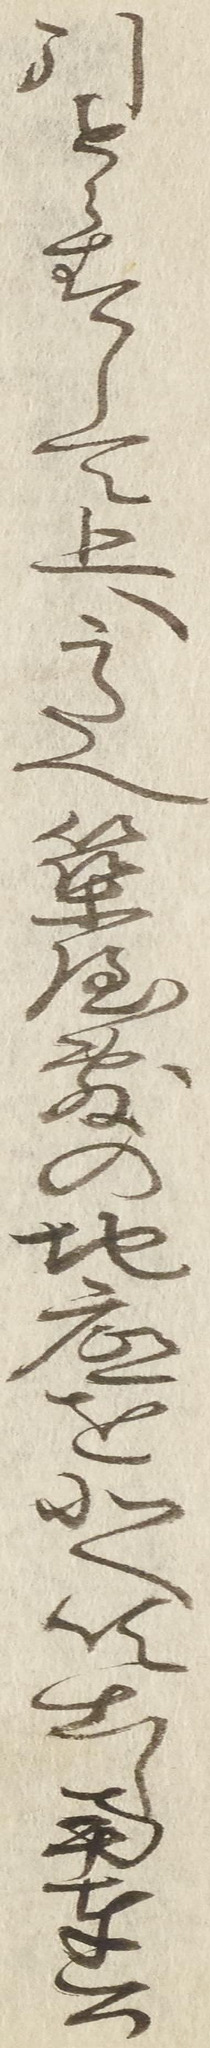引とらすして上へこたへ築屋敷の地底を北へ吹出し南奉公
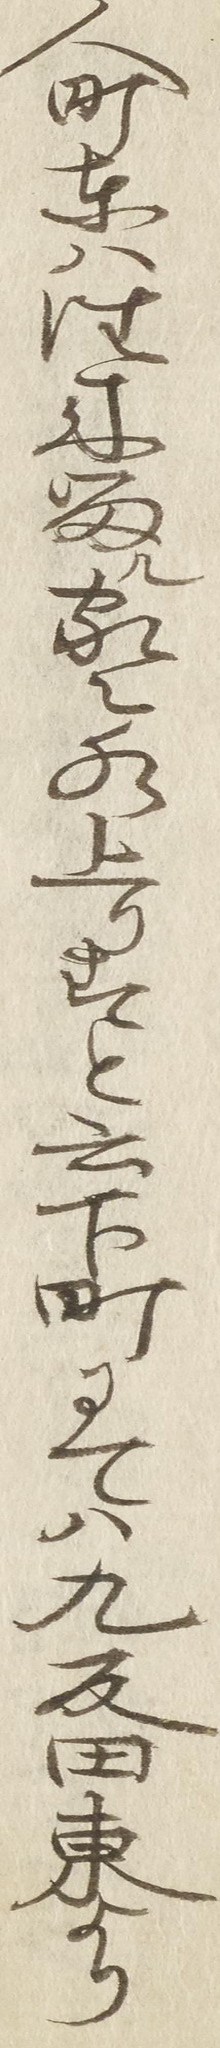人町東は往来留る家々水上りすと云下町にては九反田東より
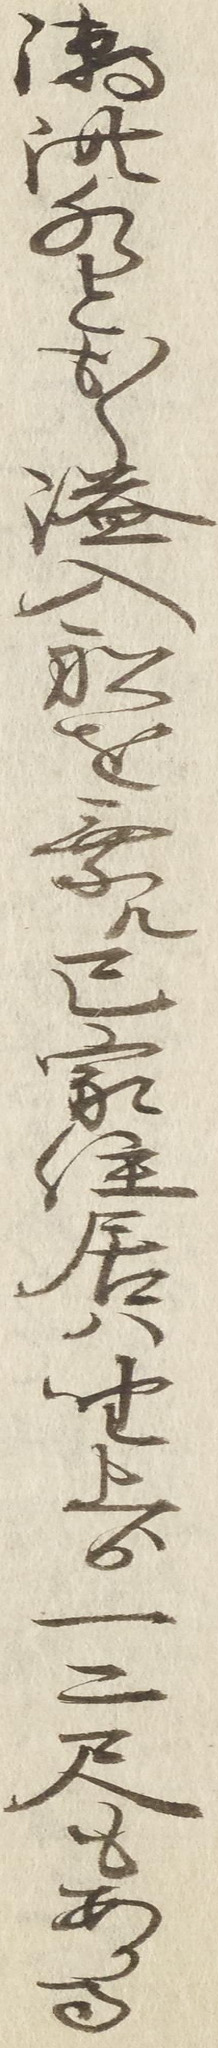漸洪水とも〳〵溢入船を乗る已家住居は座上より一二尺もあかる
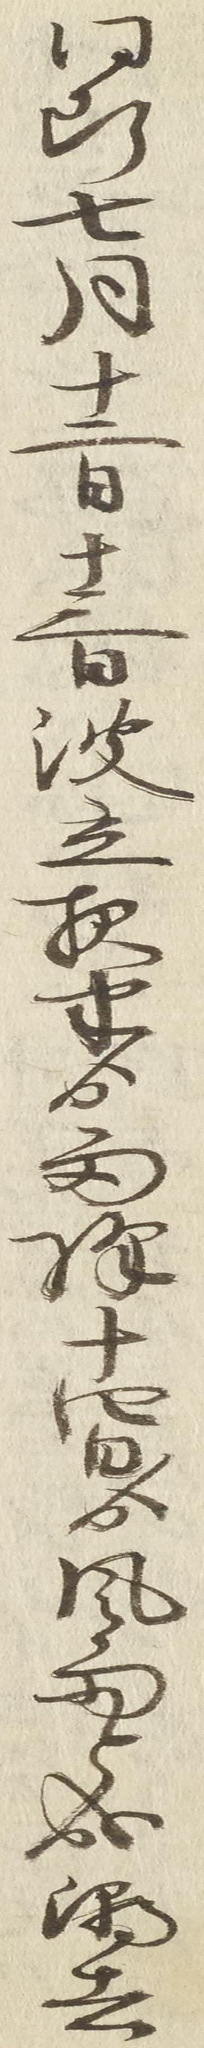同断七月十二日十三日波立夜半より雨降十四日より風雨と成潮去
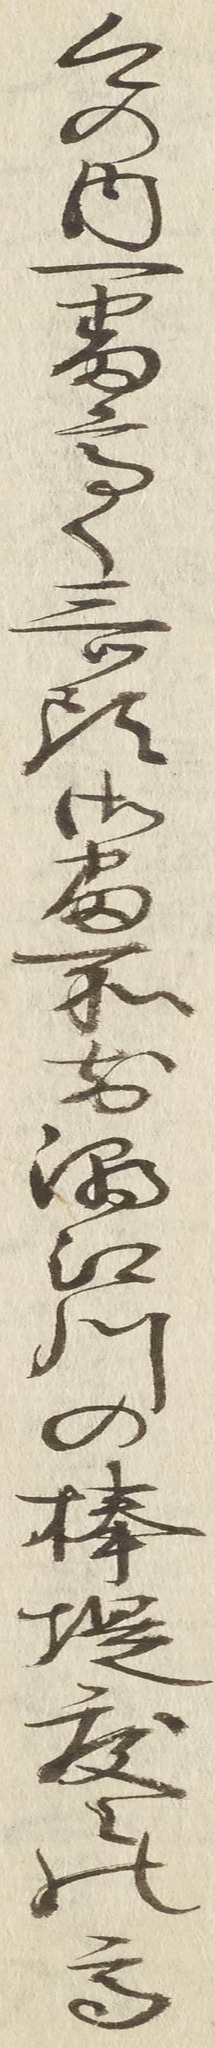今の内一番高く三つ頭御番所前潮江川の棒堤度々の高
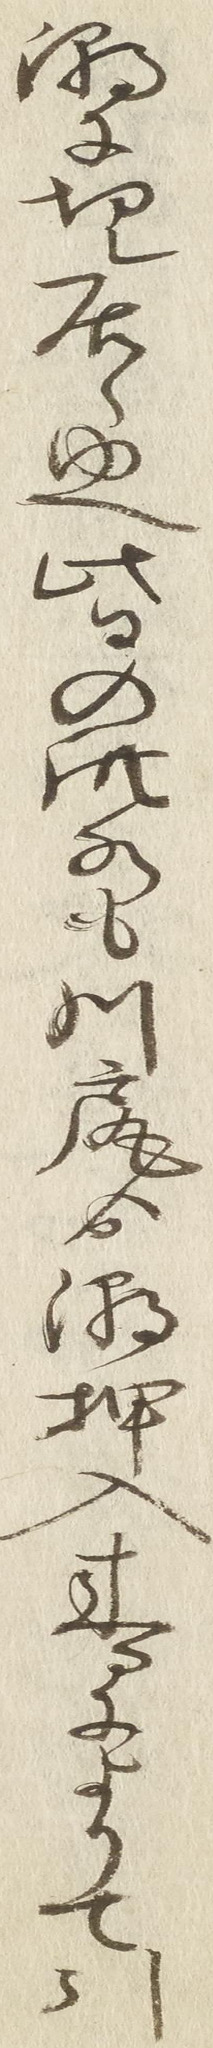潮に切れ居候ゆへ此日の洪水も川尻より潮押入来るによりて引
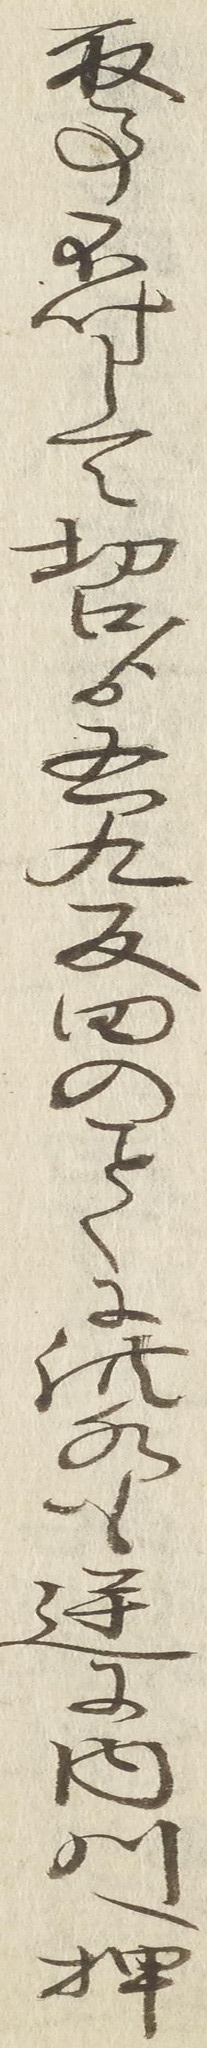取事不叶して切り口より右九反田のことく洪水も逆に内川へ押
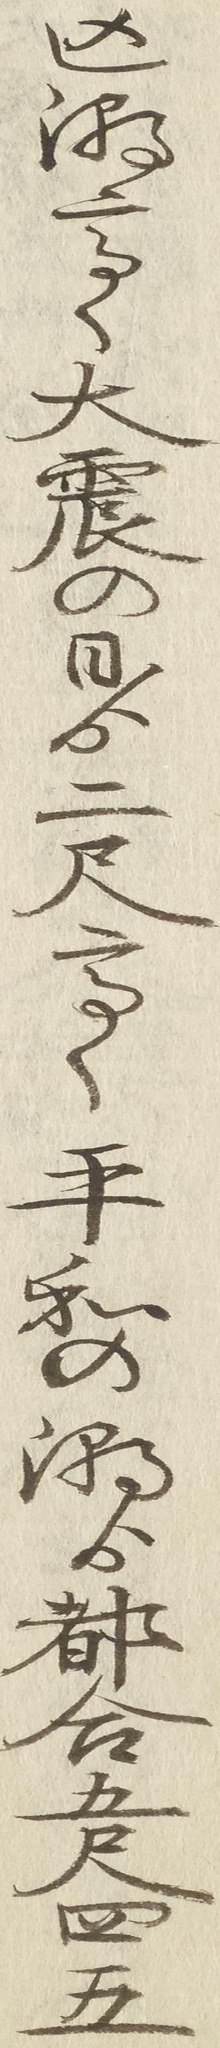込潮高く大震の日より二尺高く平和の潮より都合五尺四五
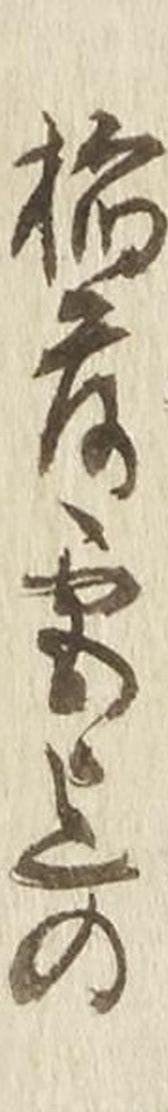稲荷宮迄の
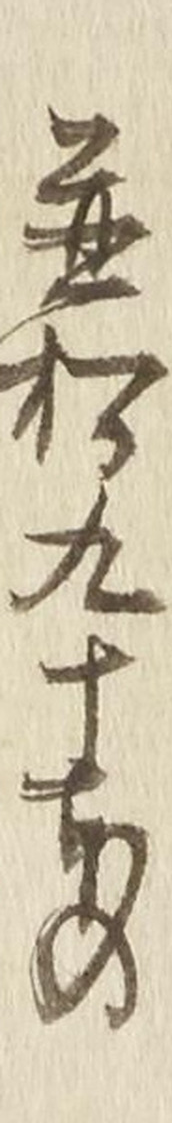並松九十本の
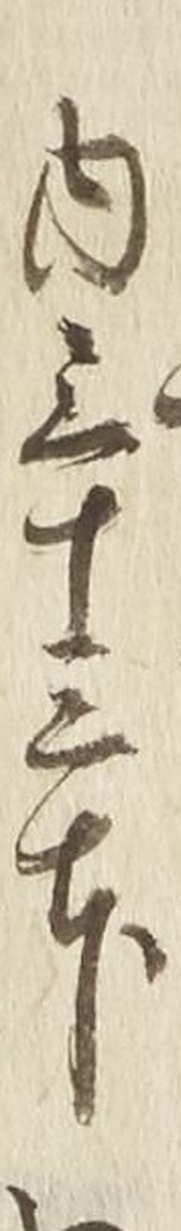内三十三本
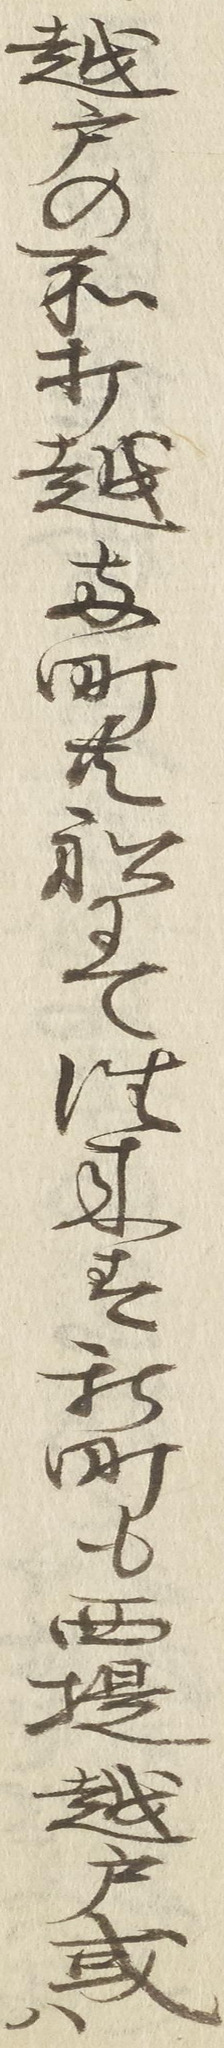越戸の所打越両町共船にて往来す新町も西堤越戸或は
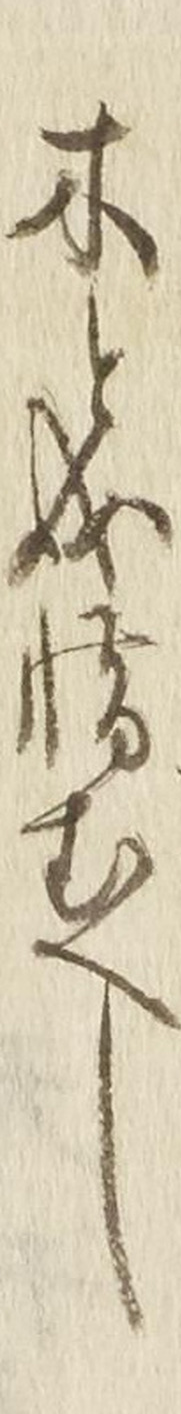木と成惜むへし
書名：地震記　上
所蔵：東京大学地震研究所図書室 Earthquake Research Institute Library, The University of Tokyo, JAPAN
